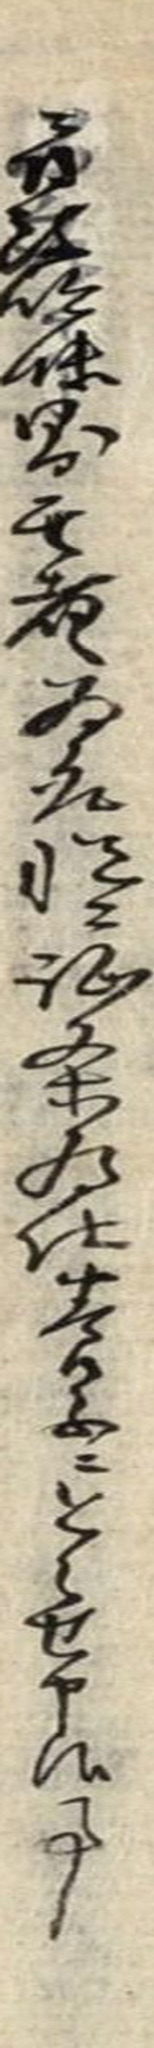に付致吟味則其者へ為取慥に証文等為仕養子にとらせ申候事
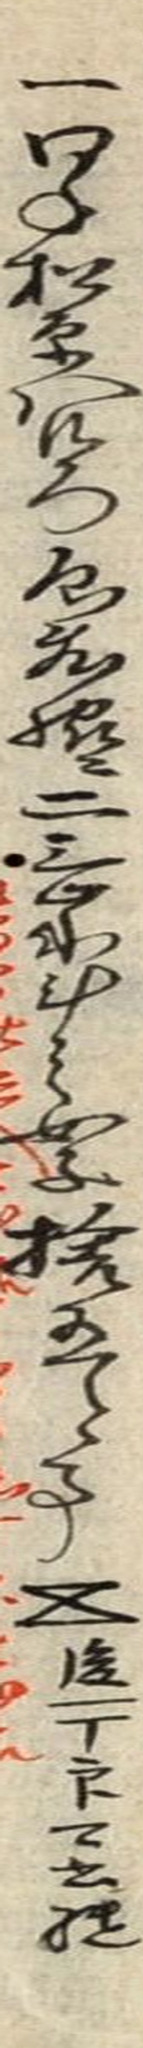一同年松原八左衛門屋敷脇に二三歳斗之女子捨有之候事後一丁印可書継
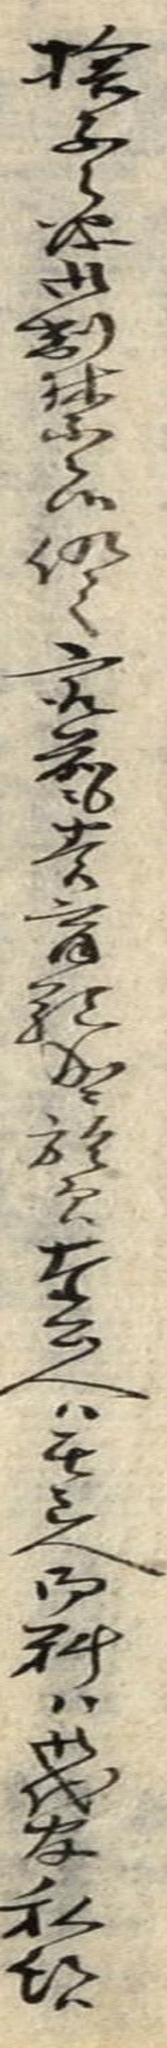捨子之儀御制禁に候仍之最前も養育難成に於ては奉公人は其主人御料は御代官私領は
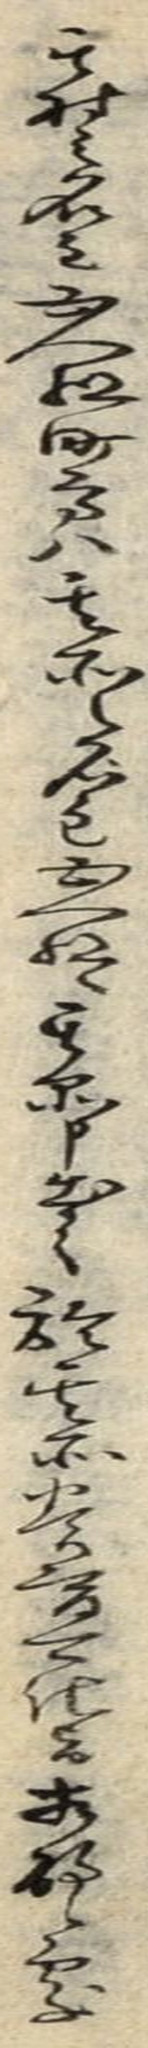其村之名主五人組町方は其所之名主五人組へ其品申出之於其所養育可仕旨相触候処
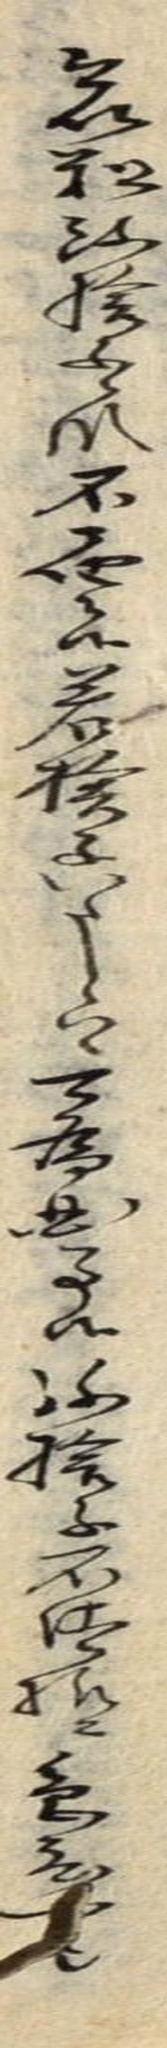今以粗致捨子候段不届に候若捨子いたし候はゝ可為曲事候弥捨子不仕候様に急度可被
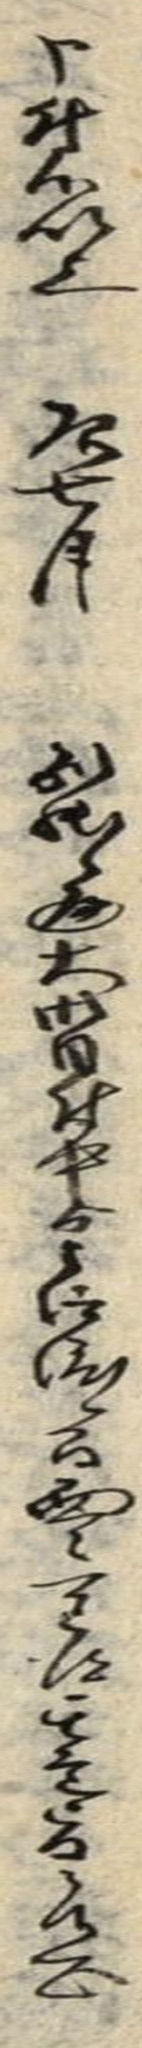申付候以上辰七月別紙之通大御目付中ゟ被仰渡候間面々可被得其意旨に候以上

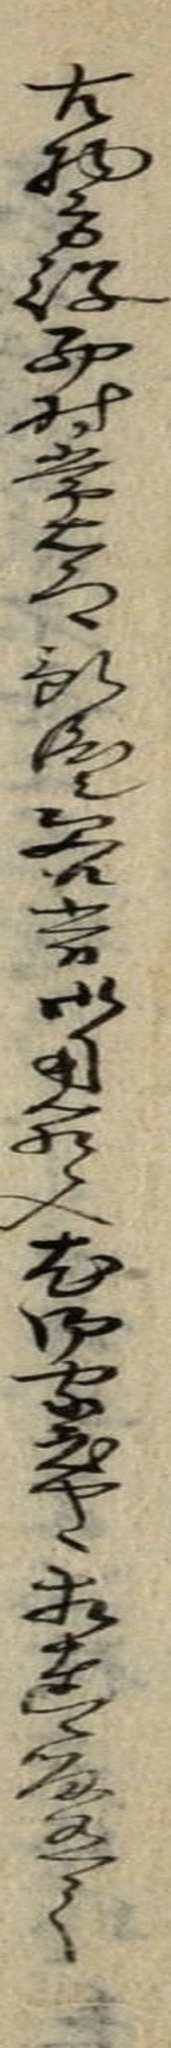古物方役西村常右衛門へ預渡シ受取書付御用箱へ入尤御家老中へ相達候留有之
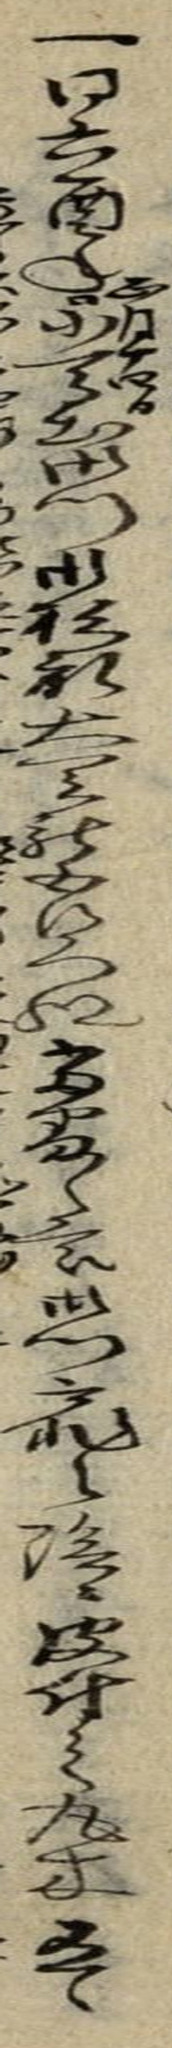一同六酉年◦小馬出正月十四日御門御杉形大関新五左衛門組当番之節御門扉之陰に皮付之丸木有之
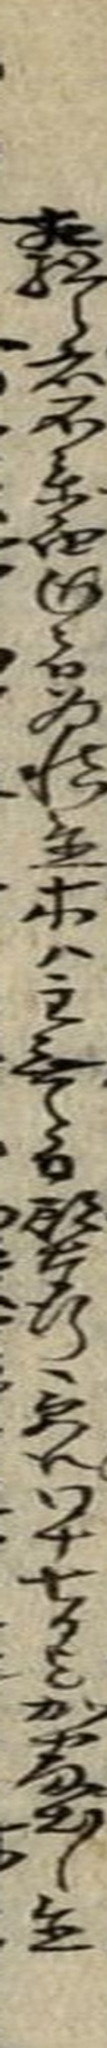候事相組之者不参届趣に付為慎置木は主無之に付郡奉行へ受取同十七日迄加番出し置
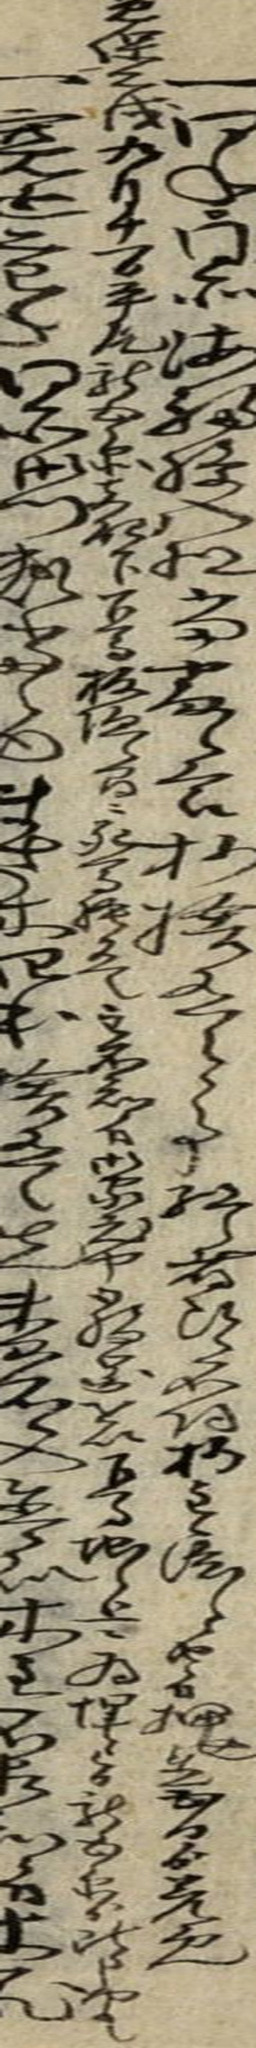一寛延二巳年同所御門頬当之内まさ木四本捨有之先番所へ入置候処木主不相知に付木蔵
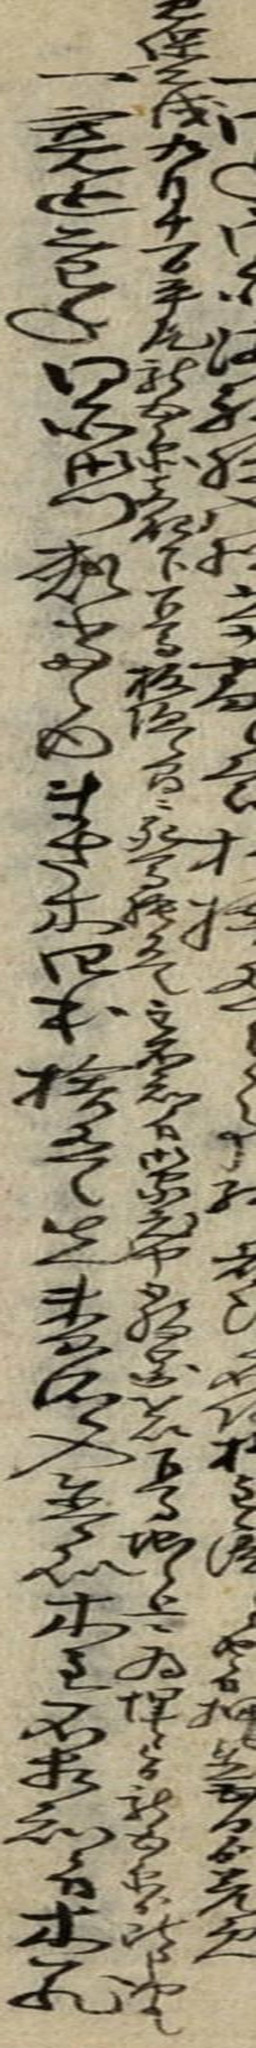一寛延二巳年同所御門頬当之内まさ木四本捨有之先番所へ入置候処木主不相知に付木蔵
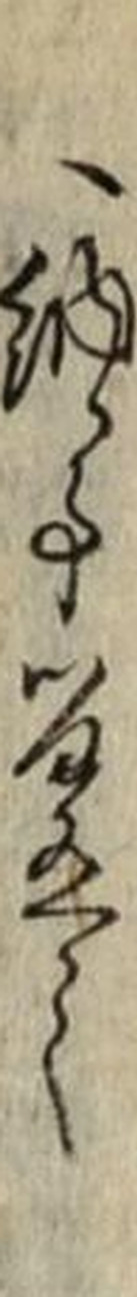へ納候事留有之
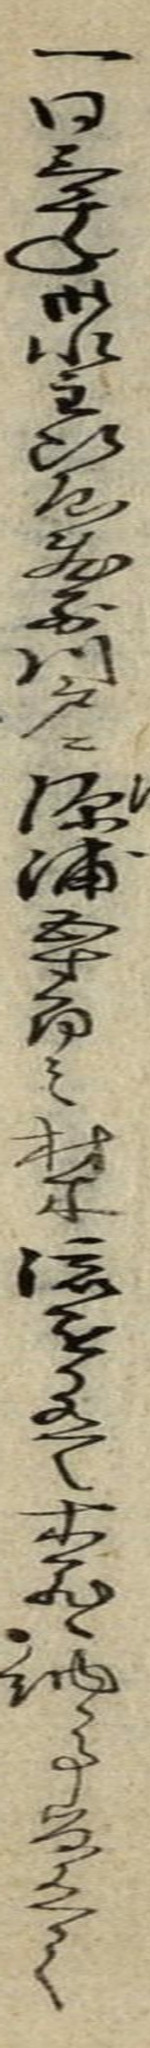一同三午年御水主頭屋敷前川戸に源浦五寸角之材木流懸り有之木蔵へ納候事留有之
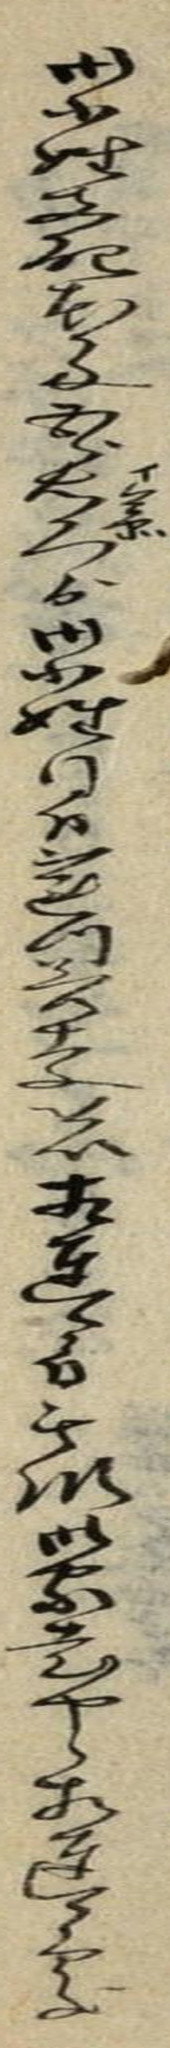御小姓支配本多五郎右衛門イ兵衛ゟ御小姓目付蓮川善大夫を以相達候に付其段御家老中へ相達候処
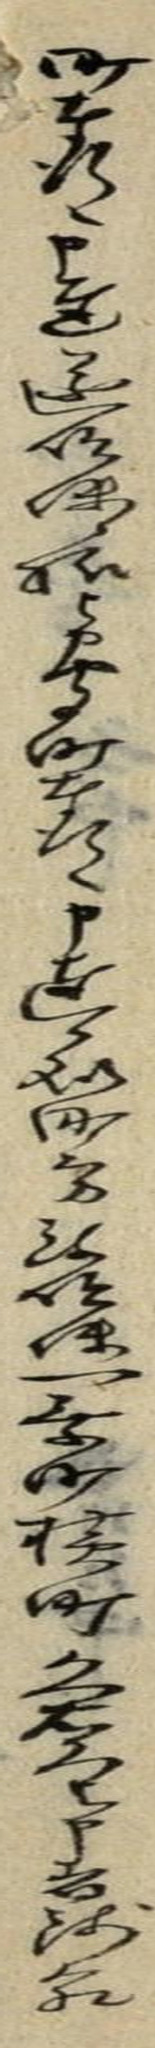町奉行へ申達遂吟味候様被申聞町奉行へ申達候処町方致吟味一乗町横町久右衛門と申者銭箱
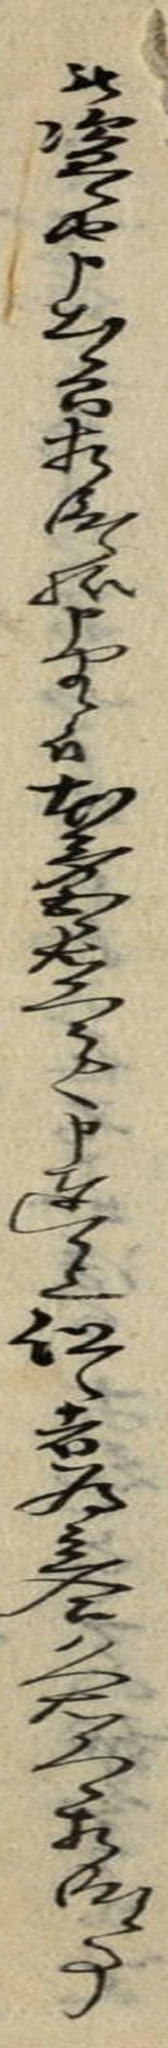被盗候由申出候間相渡候様申聞候に付本多五郎右衛門方へ申達候上組之者為立合久右衛門へ相渡候事
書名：御停止異変死失
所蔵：福井県文書館 Fukui Prefectural Archives
